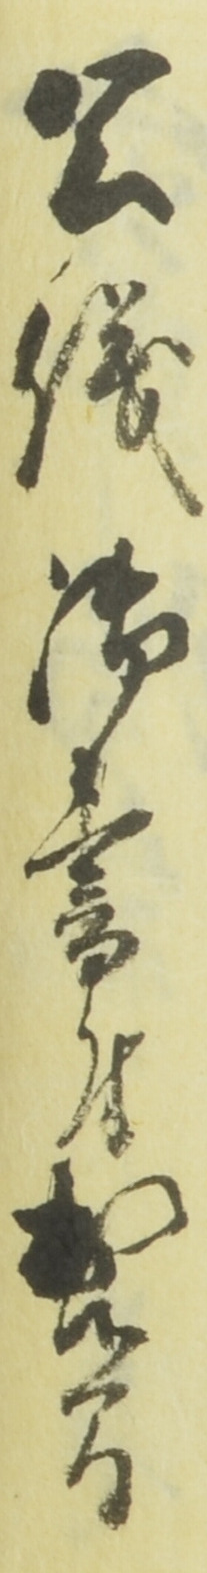公儀御書付出候間
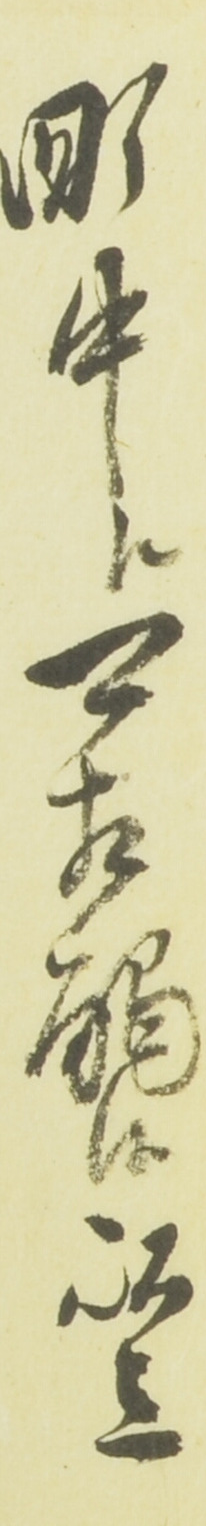町中江可相触候以上
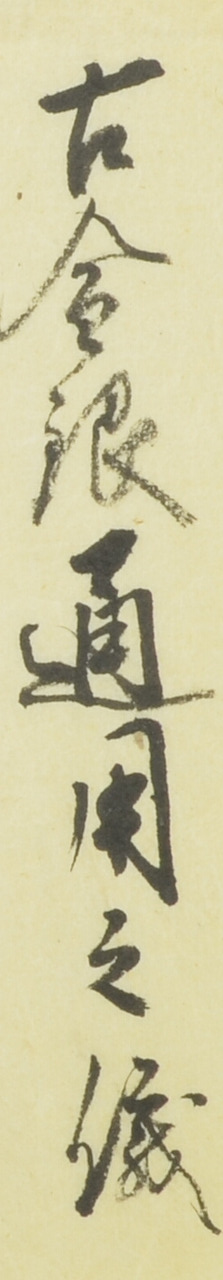古金銀通用之儀
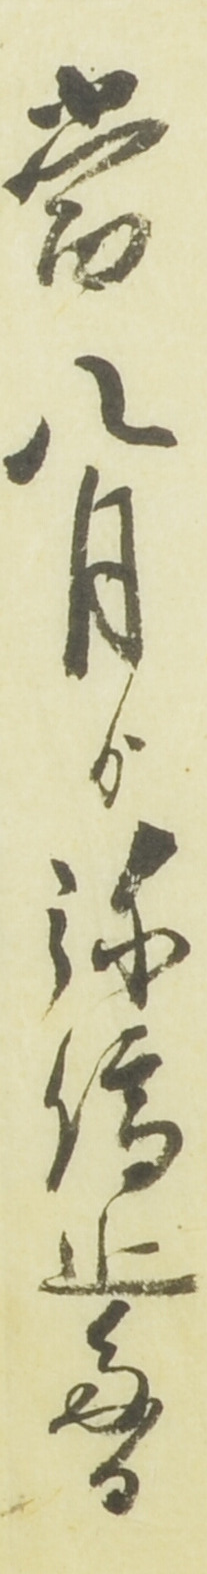当八月ゟ弥停止たる
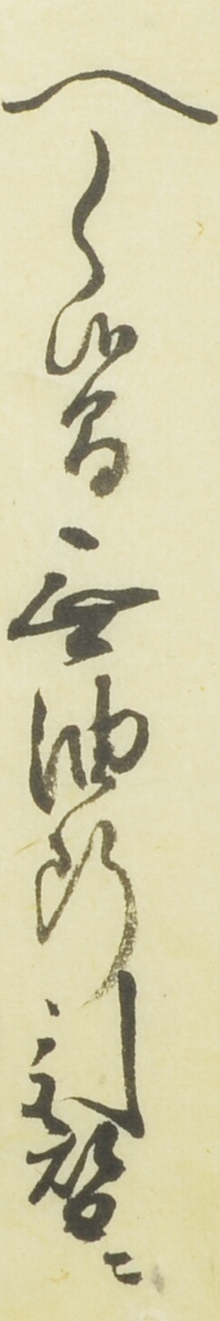へく候間無油断引替ニ
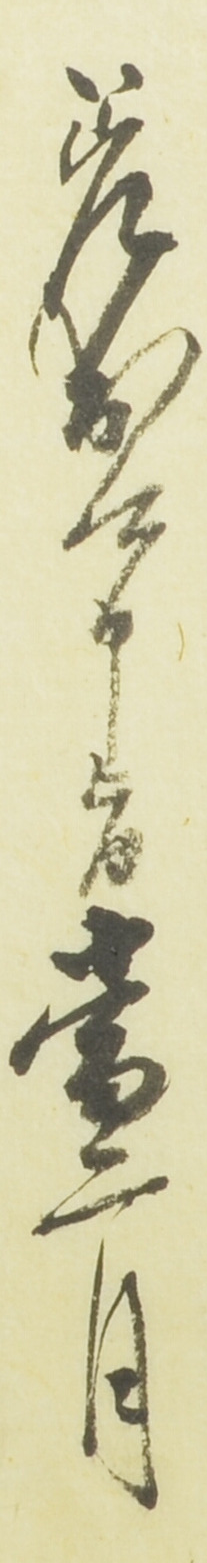差出可申旨当二月
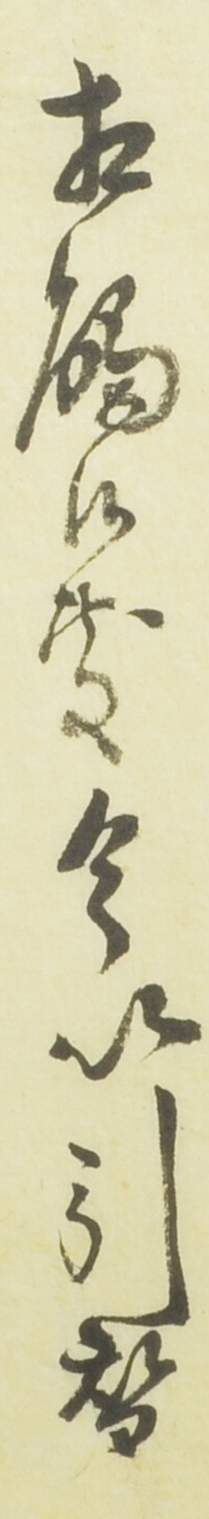相触候処今以引替
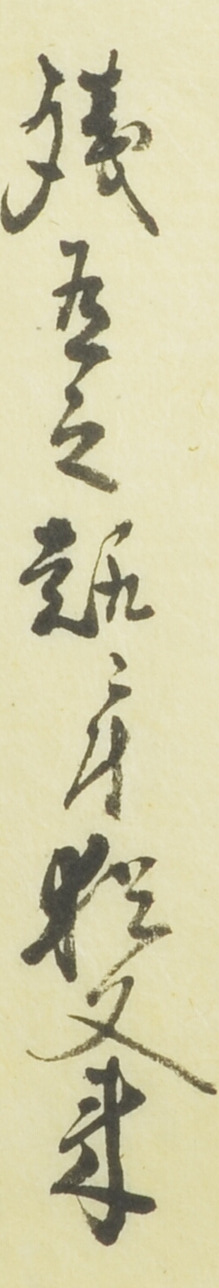残有之趣ニ付猶又来
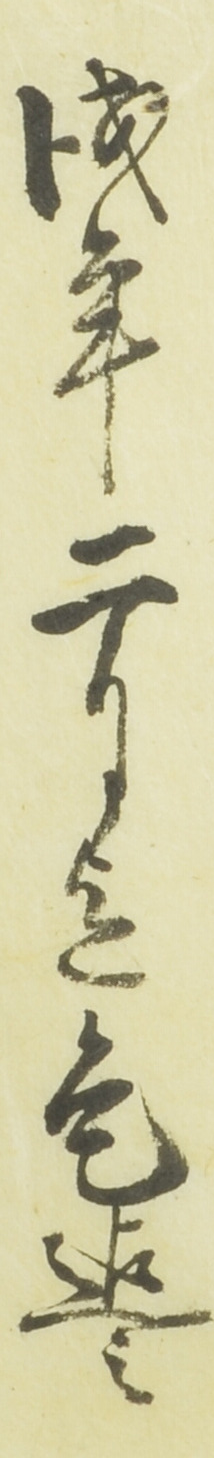戌年二月迄是迄之
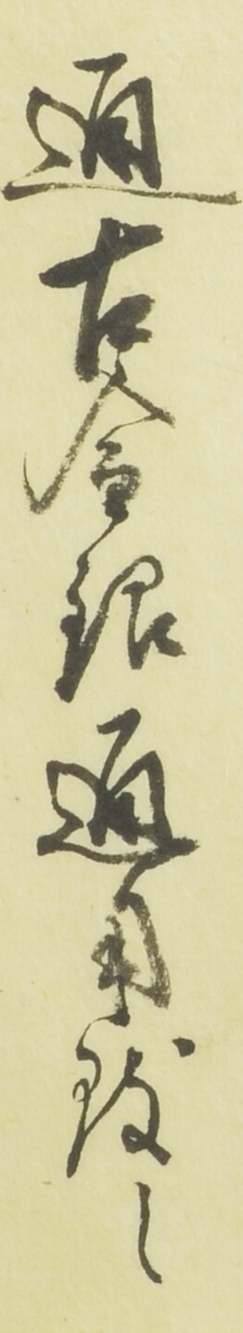通古金銀通用致し
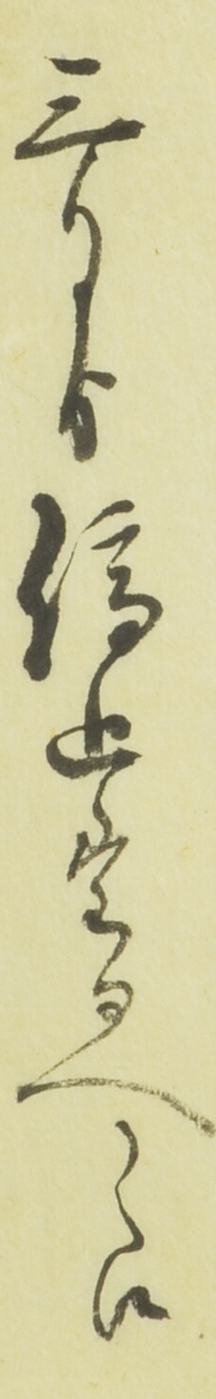三月ゟ停止たるへく候
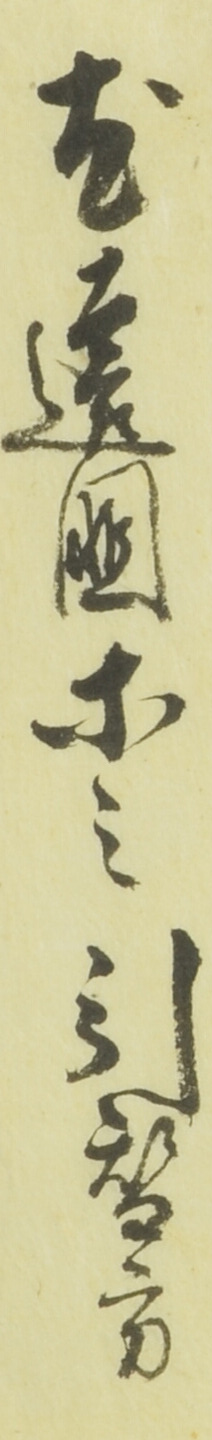尤遠国等之引替方
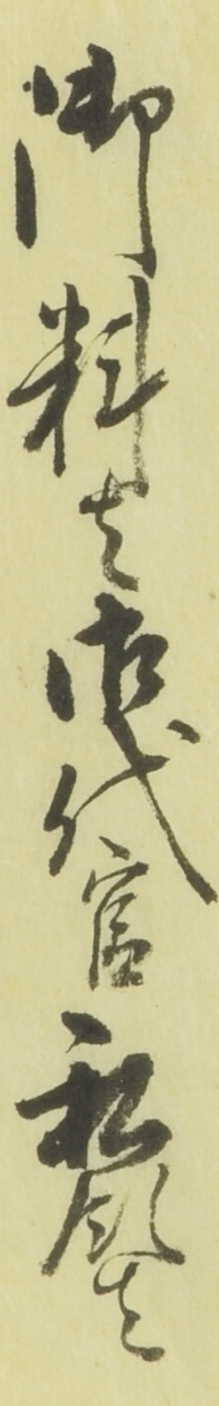御料は御代官私領は

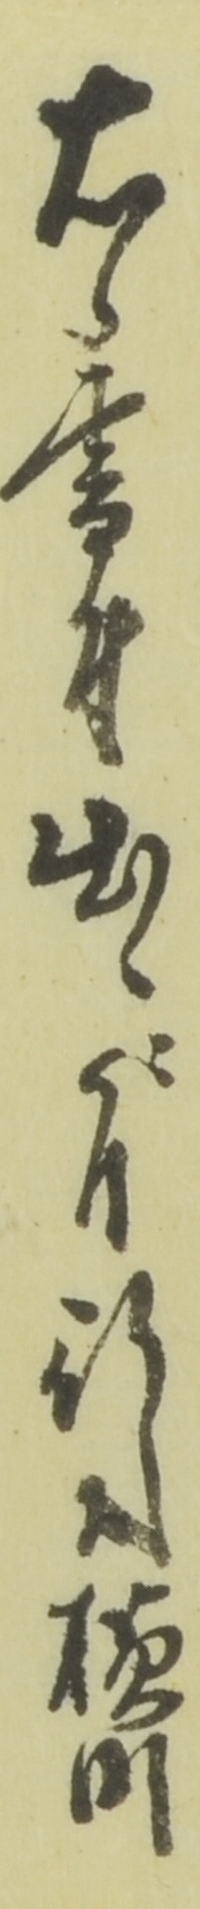右御書付出候ニ付行司横町
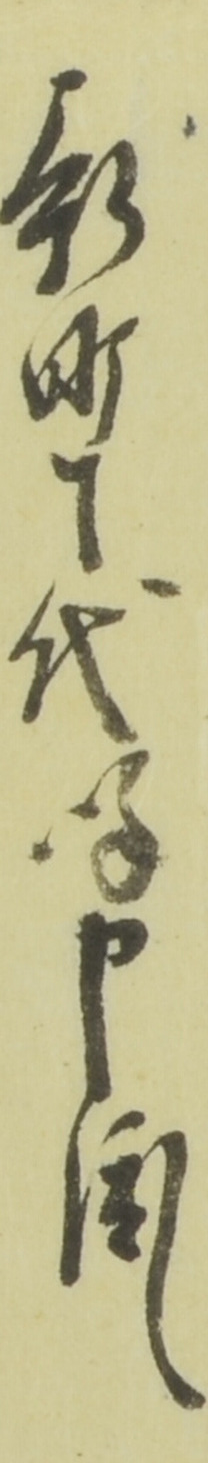新町丁代呼申渡候
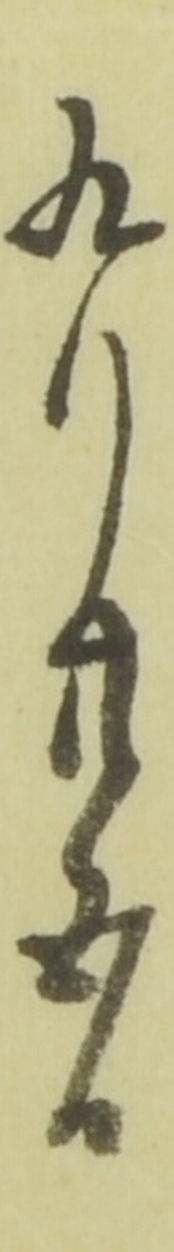九月廿五日
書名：御触書御書附控
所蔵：伊那市立高遠町図書館・合同会社AMANE
